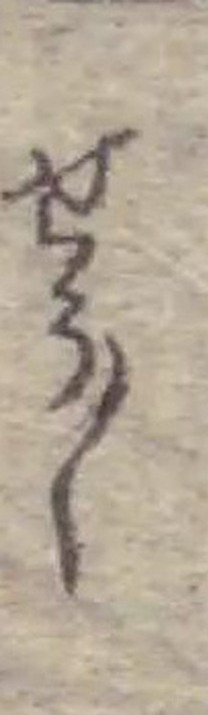せう〳〵
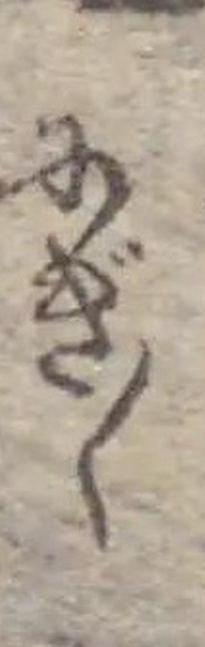にぎ〳〵
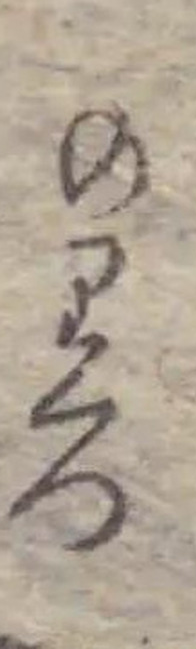のりくつ
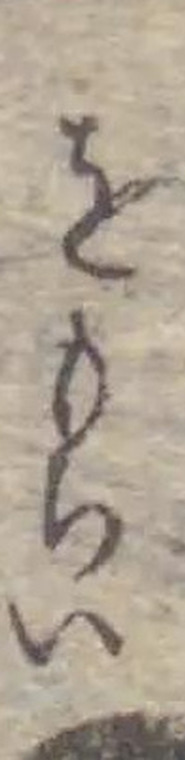をもちい
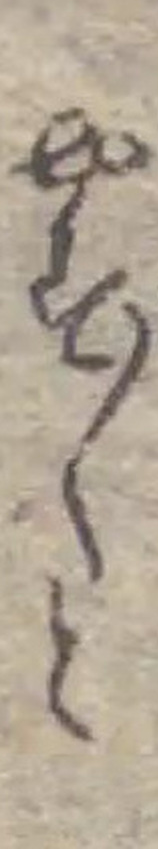やす〳〵と
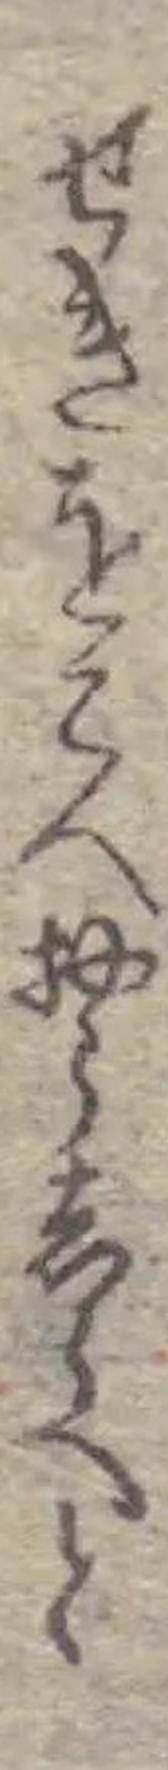せきをこへおうしうへと
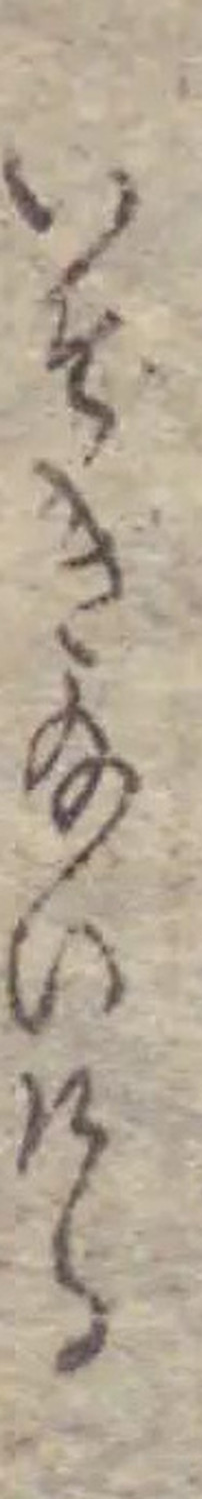いそき給ひける
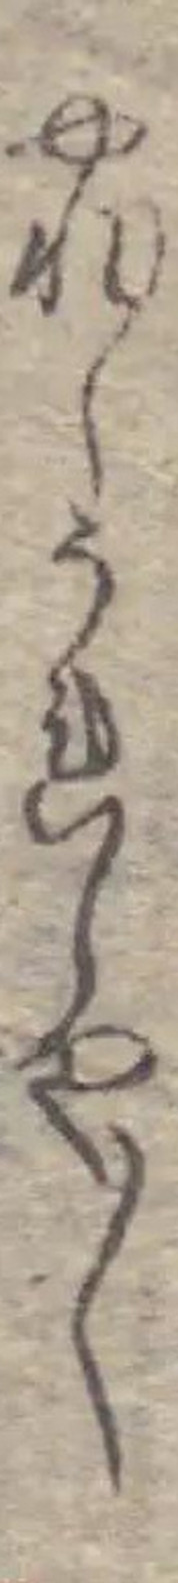やれ〳〵うれしや〳〵
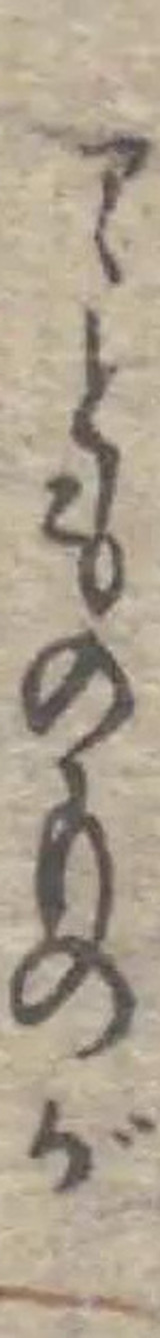アヽとものものが
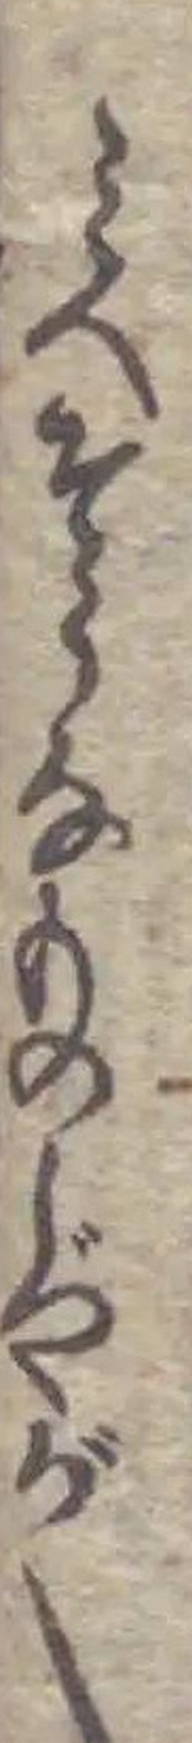みへそうなものじやが

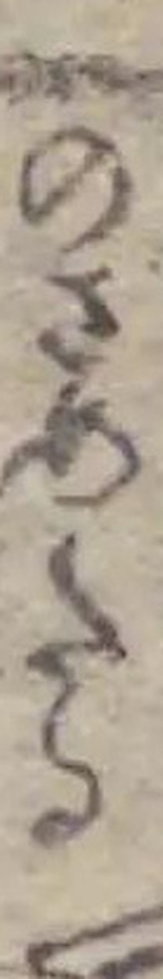のさめたる
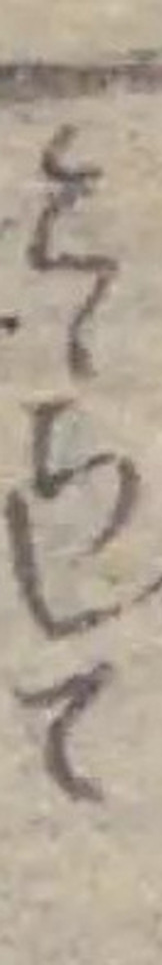こゝちして
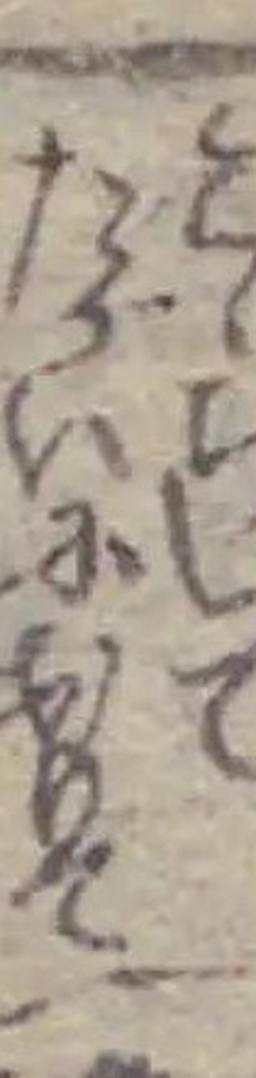たがいにおもて
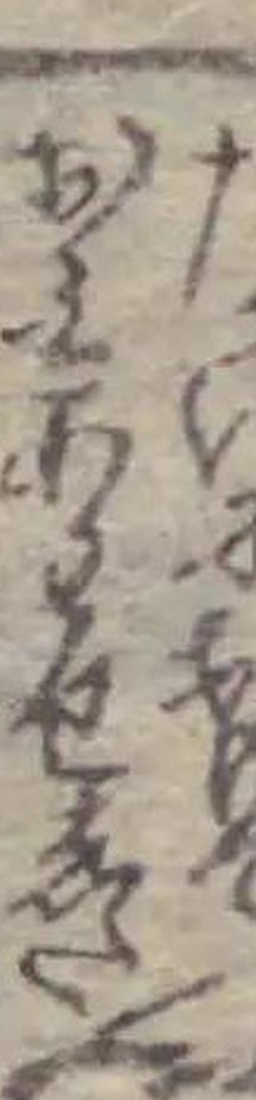おみあわせした
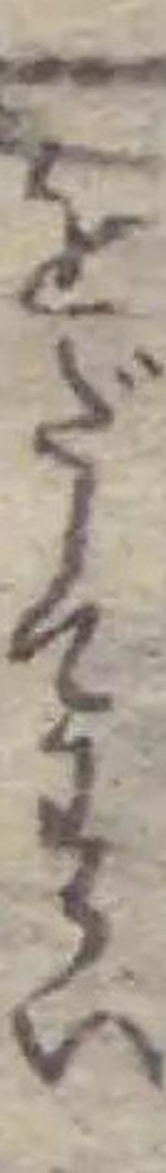をだしてわらい
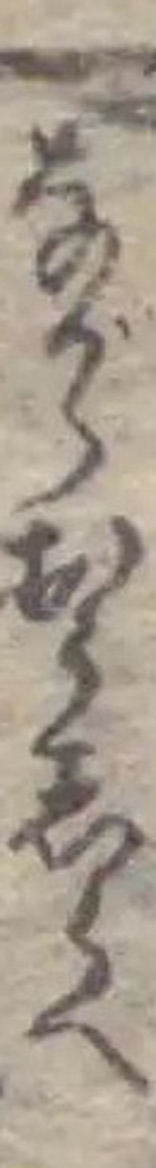ながらおうしうへ
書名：通増安宅関 2巻
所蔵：国立国会図書館 National Diet Library, JAPAN
